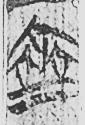齊
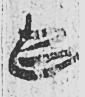𠂤
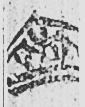齊
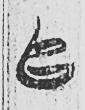𠂤
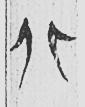北
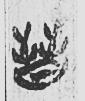晉
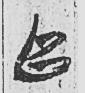𠂤
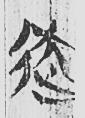迖
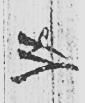之
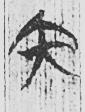內
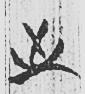至
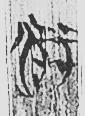汧
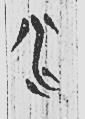水
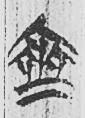齊
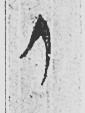人
